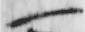一
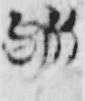斪
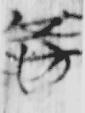汸
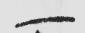一
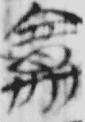賽
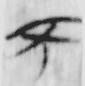不
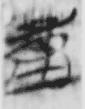量
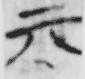亓（其）
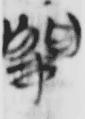○（關）
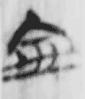金
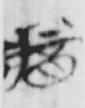𬨭（將）
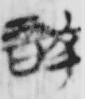○（證）
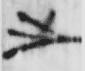之
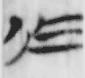於
